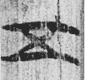五（伍）
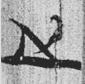之
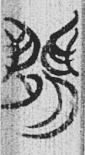○（閒）
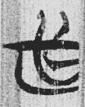必
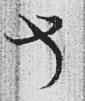又（有）
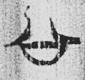公
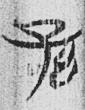孫
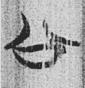公
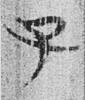子
